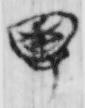圑
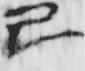己
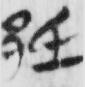邸
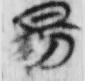昜（陽）
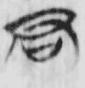君
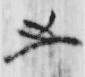之
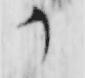人
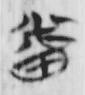番
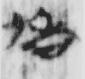俈
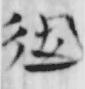○（卜）
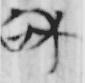和
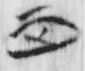正
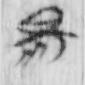昜（陽）
